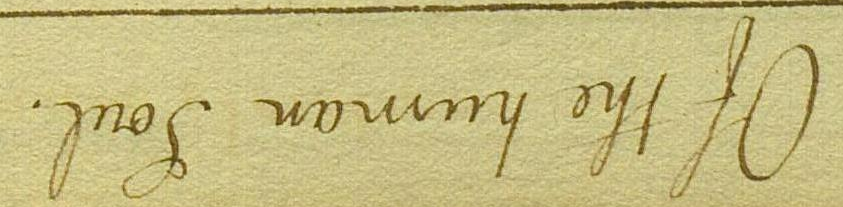Of the human Soul.
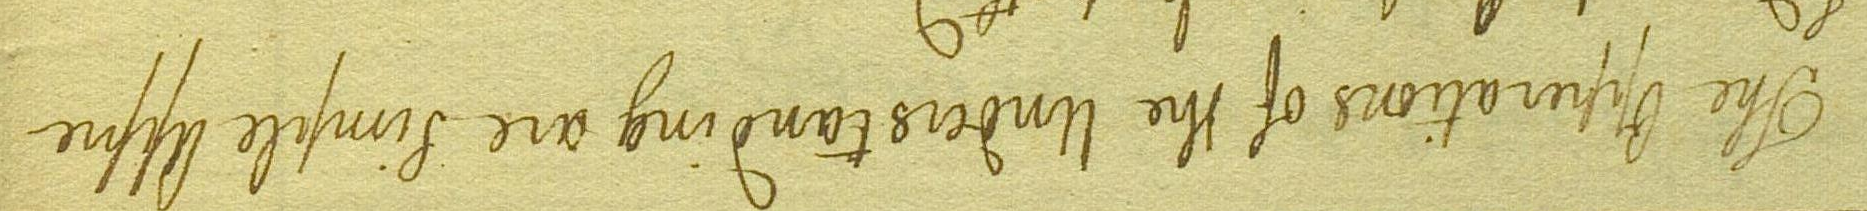The Opperations of the Understanding are Simple Appre-
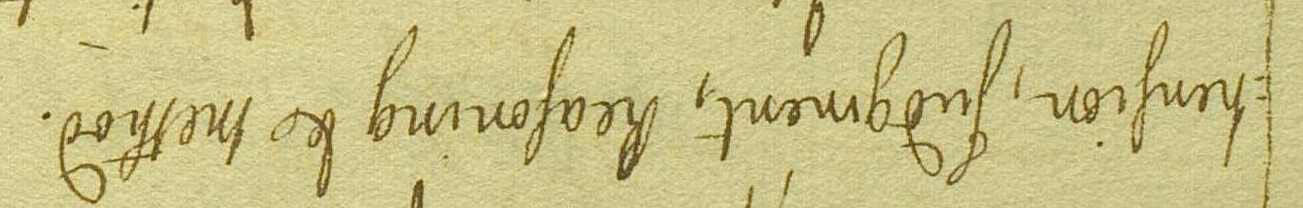-hension, Judgment, Reasoning & method.
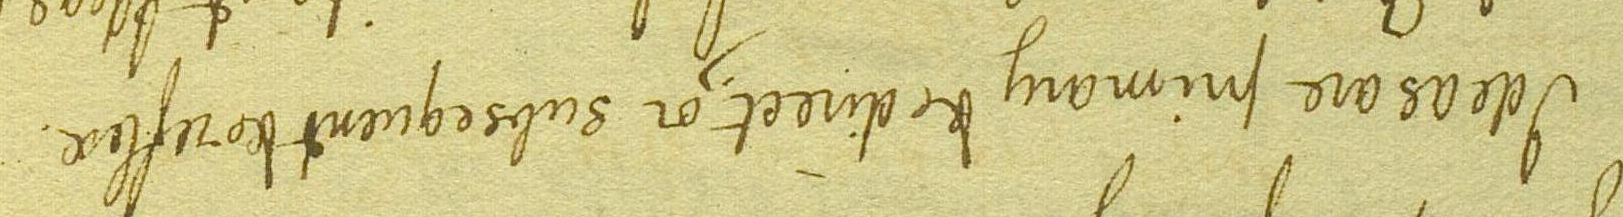Ideas are primary & direct, or subsequent & reflex.
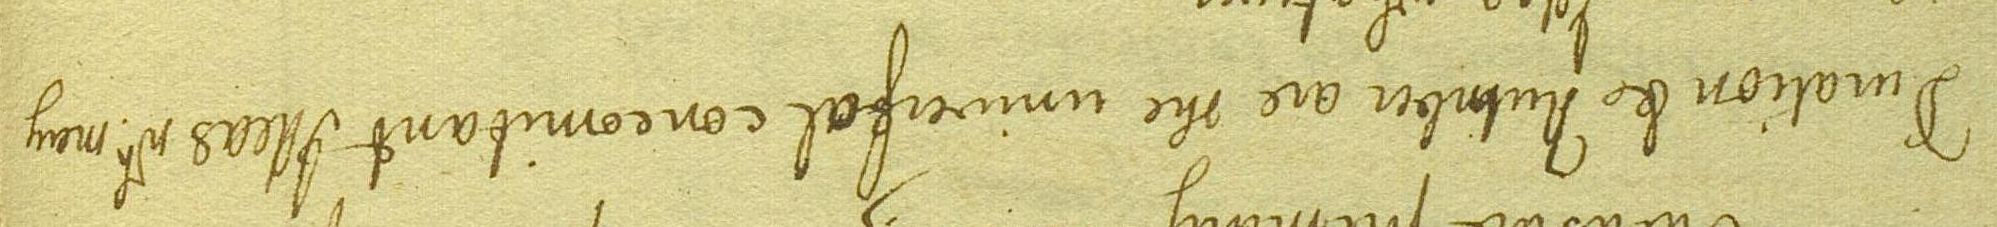Duration & Number are the universal concomitant Ideas w^h. may
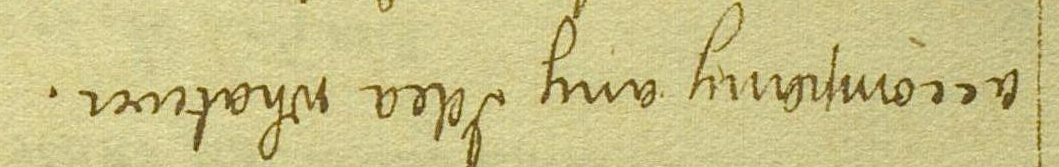accompany any Idea whatever.
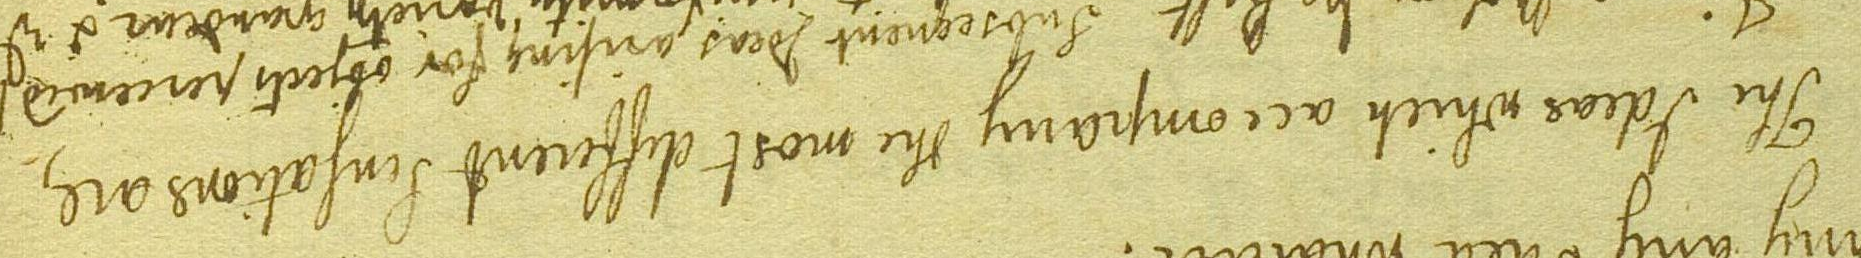The Ideas which accompany the most different Sensations are,
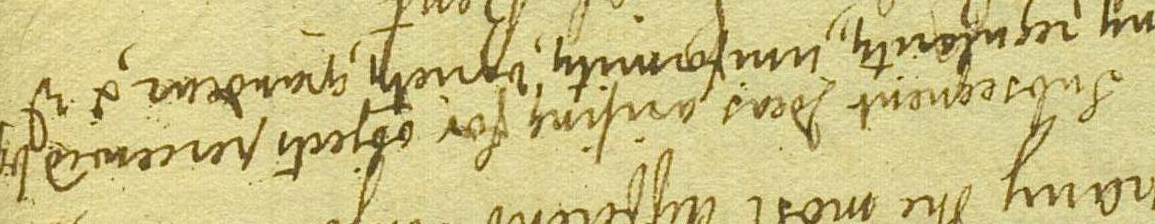Subsequent Ideas arising for objects perceived by
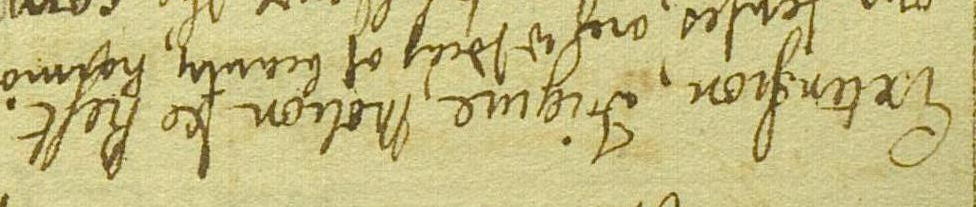Extension, Figure, Motion & Rest.
